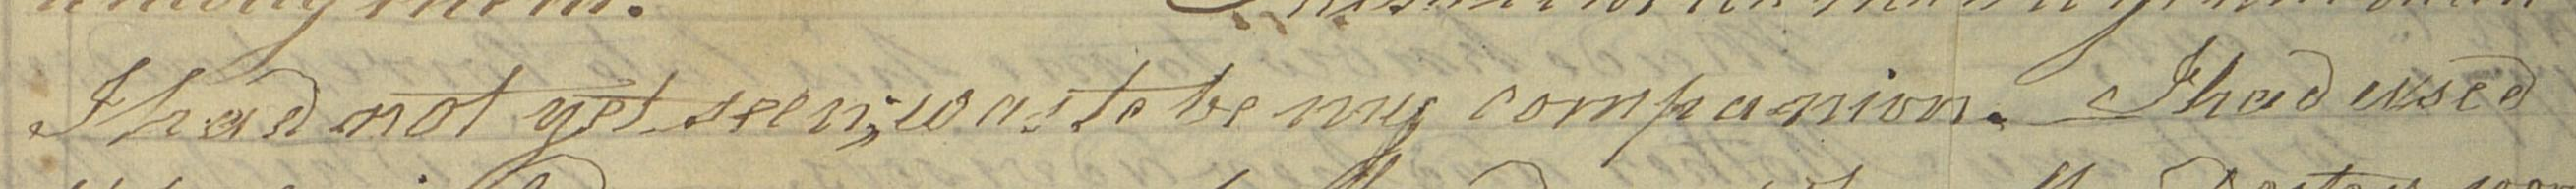I had not yet seen; was to be my companion. I had used
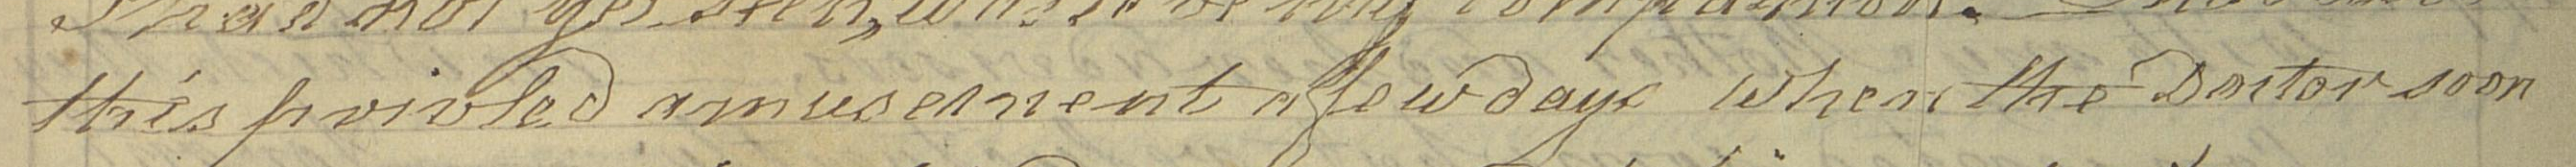this pvivsed amusement a few days when the Doctor soon
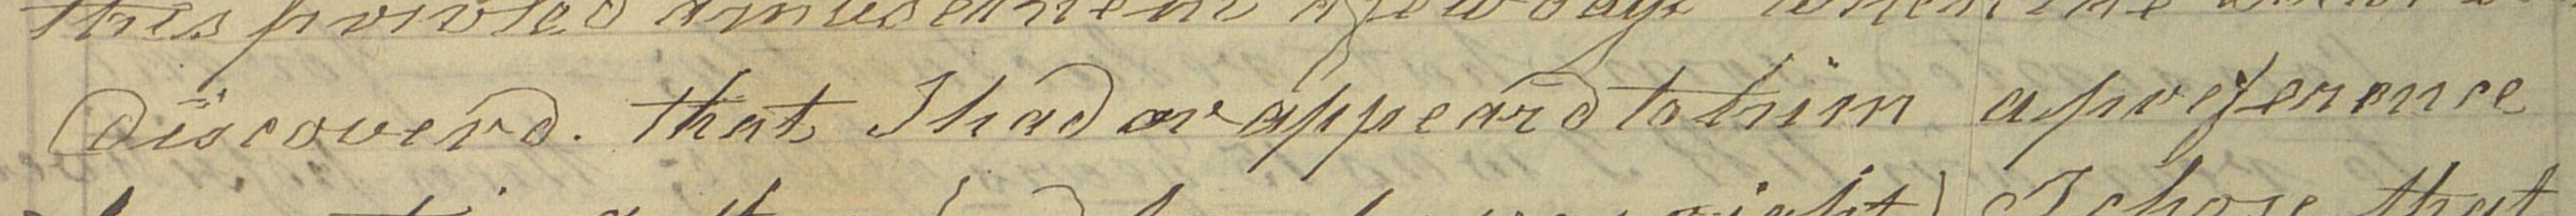discoverd. that I had or appered to him assurance
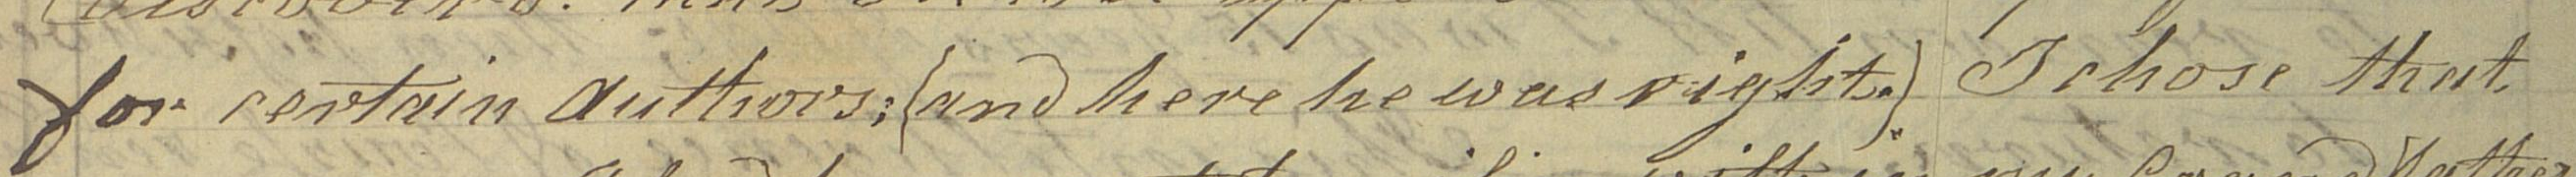for certain authors; (and here he was right.) I chose that
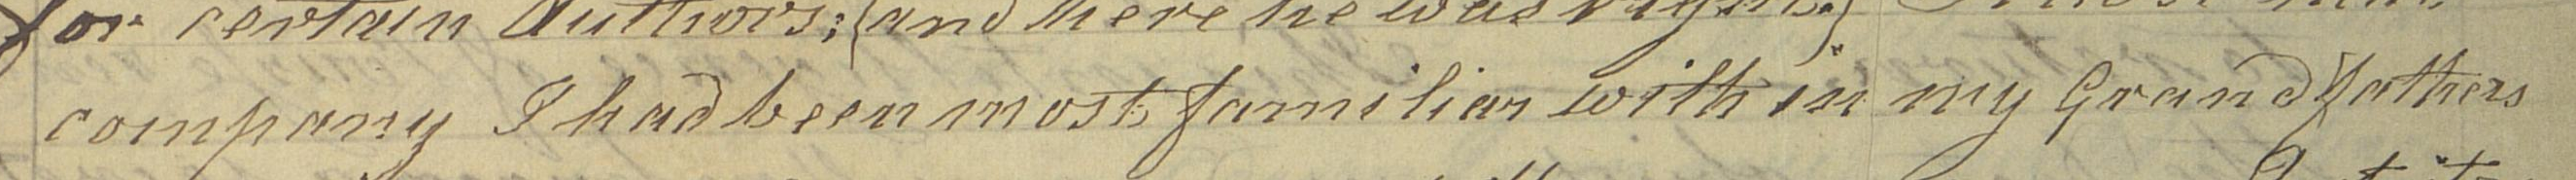company I had been most familiar with in my grandfathers
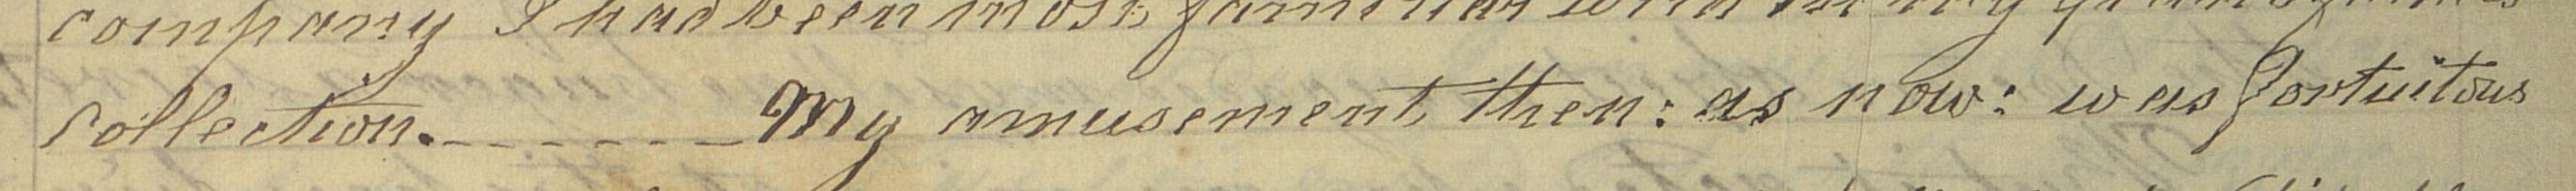Collection. My amusement then: as now: was fortuitous
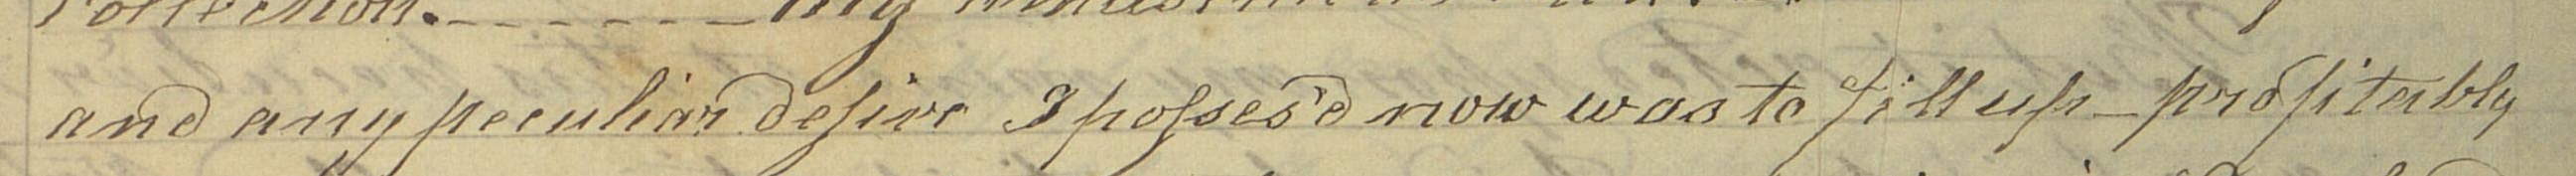and any peculiar desire I posses'd now was to fill up, profitably
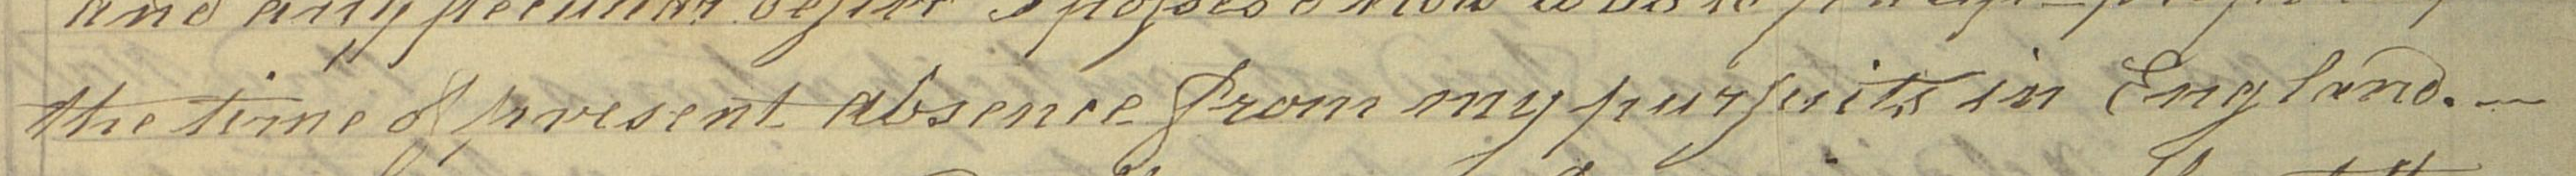the time of present absence from my pursuits in England.
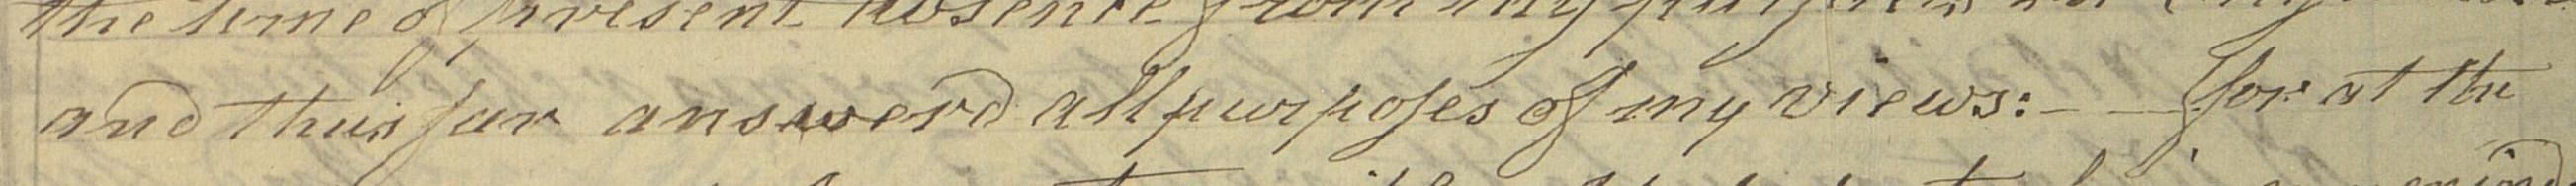and thus far answerd all purposes of my views: for at the
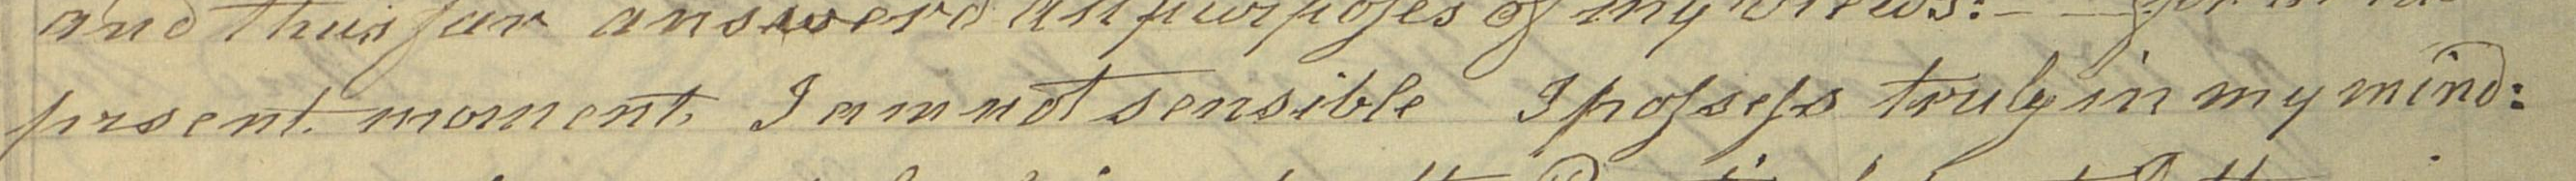present moment I am not sensible I possess truly in my mind:
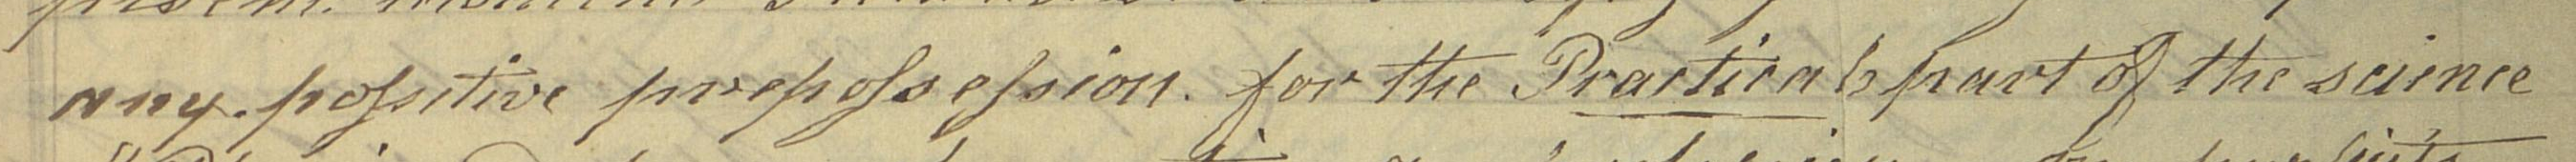any possitive prepossession for the Practical part of the science
